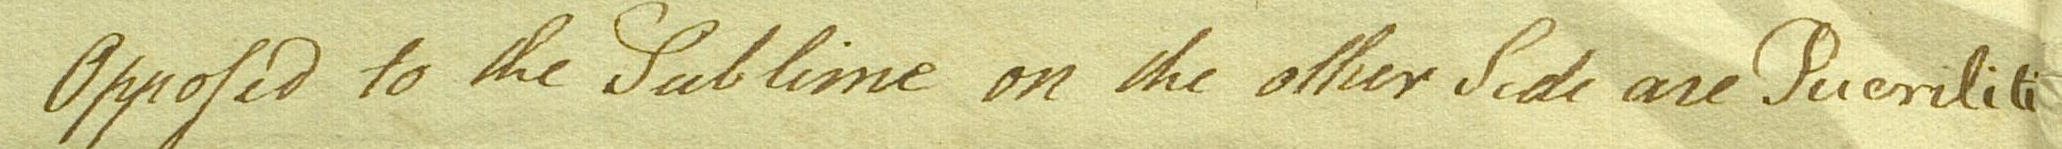Opposed to the Sublime on the other Side are Pueriliti
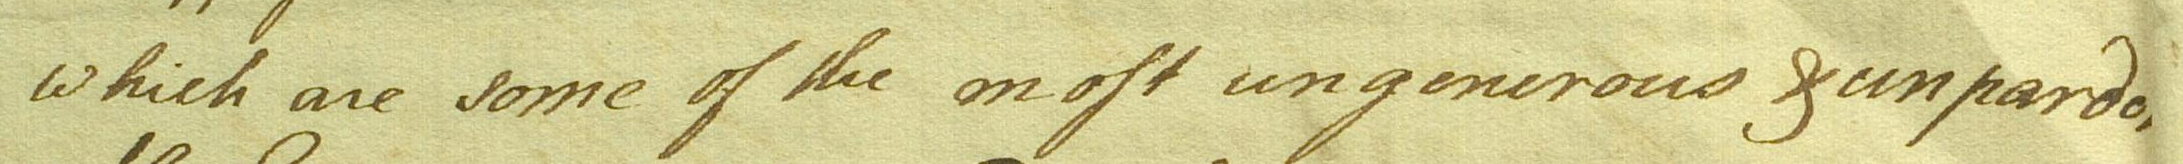which are some of the most ungenerous & unpardo
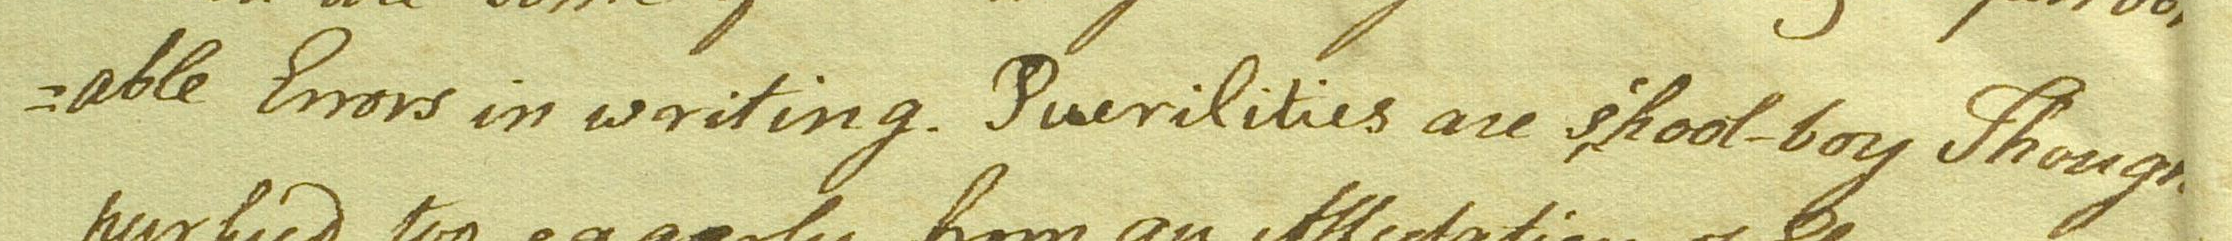-able Errors in writing. Puerilities are s^chool-boy Though
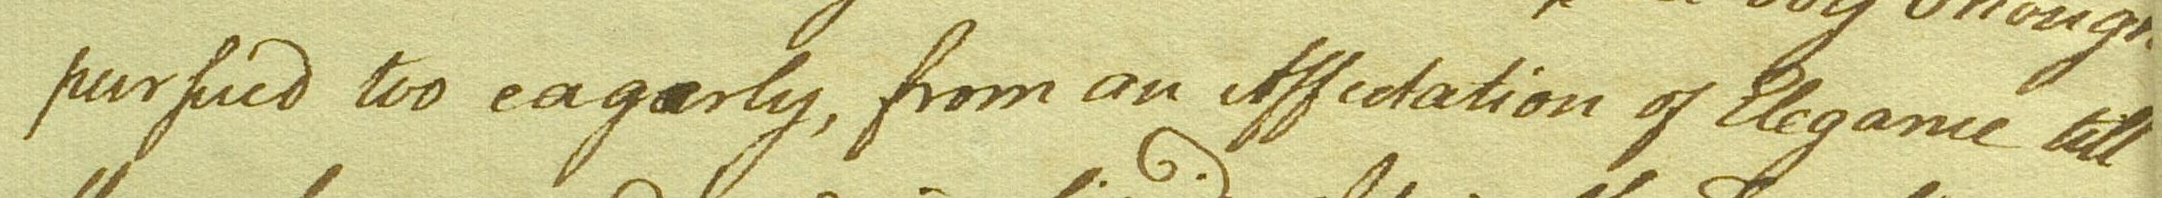pursued too eagerly, from an affectation of Elegance till
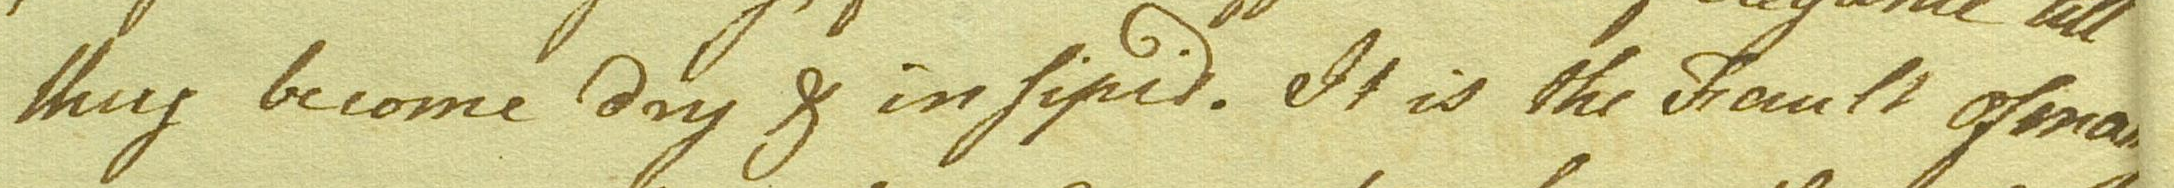they become dry & insipid. It is the Fault of many
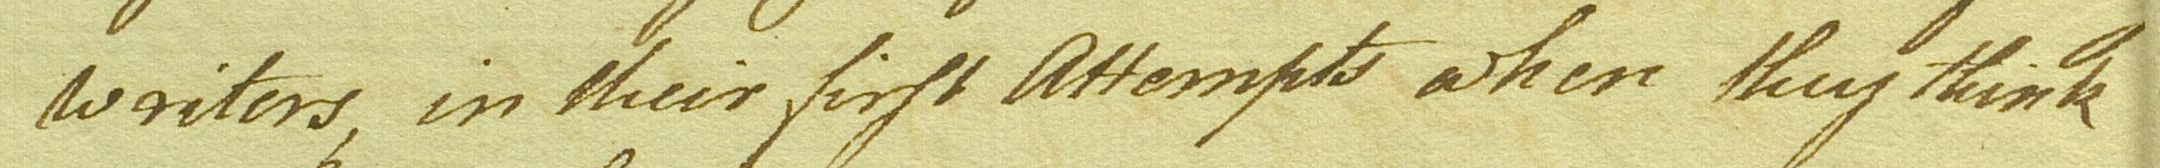writers, in their first Attempts when they think
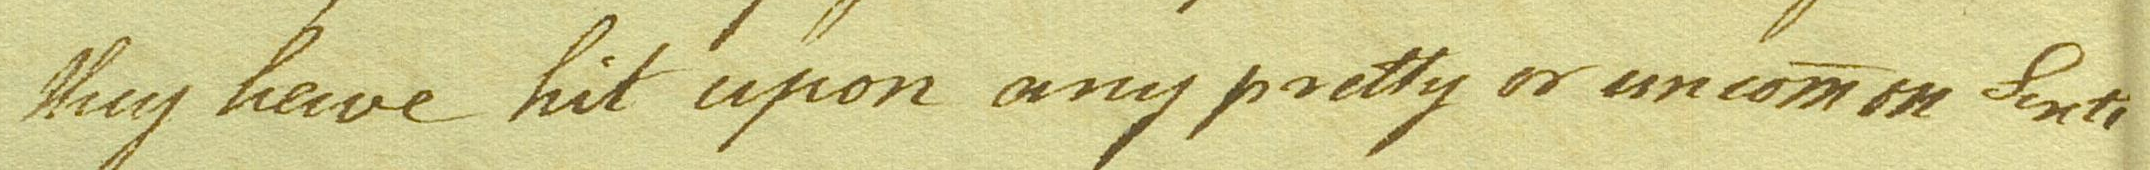they have hit upon any pretty or uncom̄on Senti
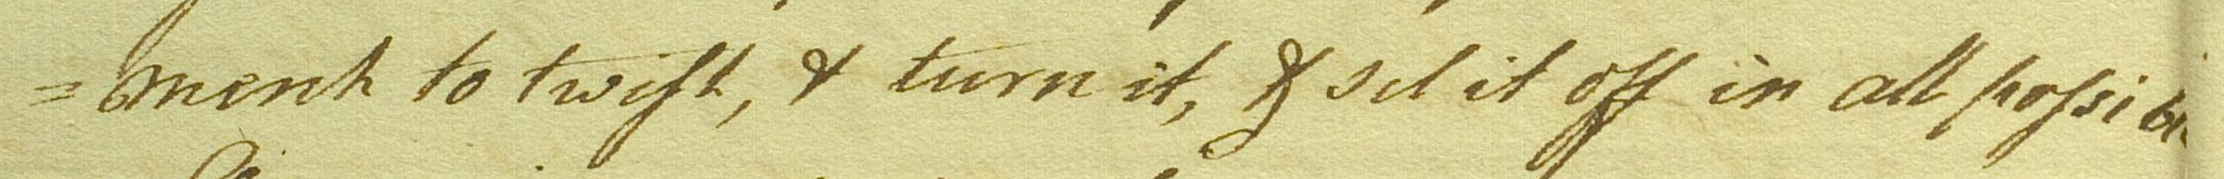-ment to twist, & turn it, & set it off in all possible
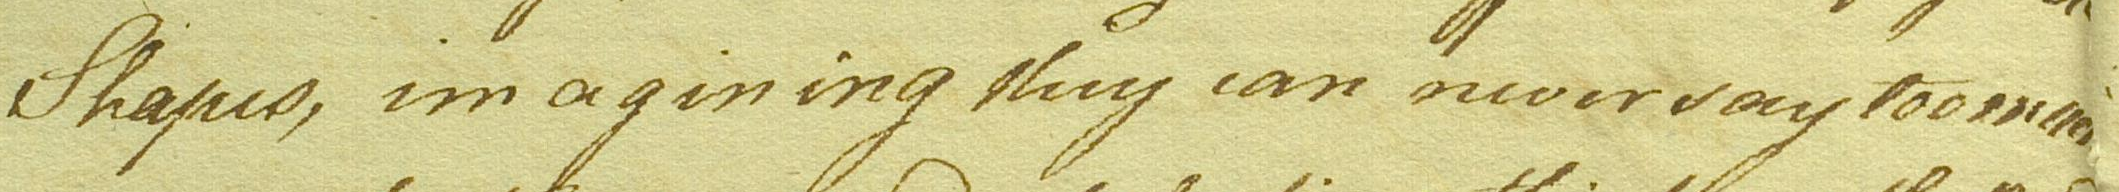Shapes, imagining they can never say too much
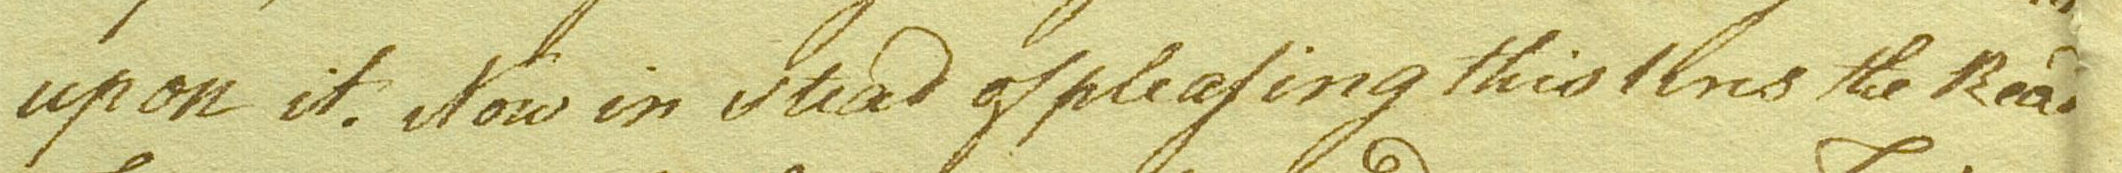upon it. Now instead of pleasing this [__]ns the Read
